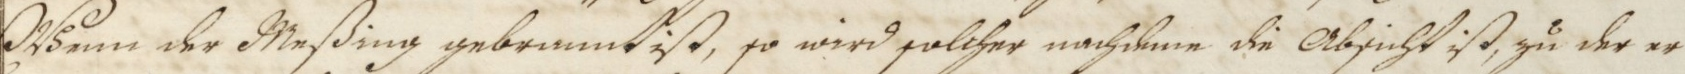Wenn der Meßing gebrannt ist, so wird solcher nachdeme die Absicht ist, zu der er
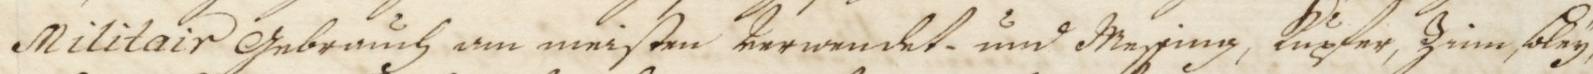Militair Gebrauch am meisten verwendet- und Messing, Kupfer, Zinn, Bley,
